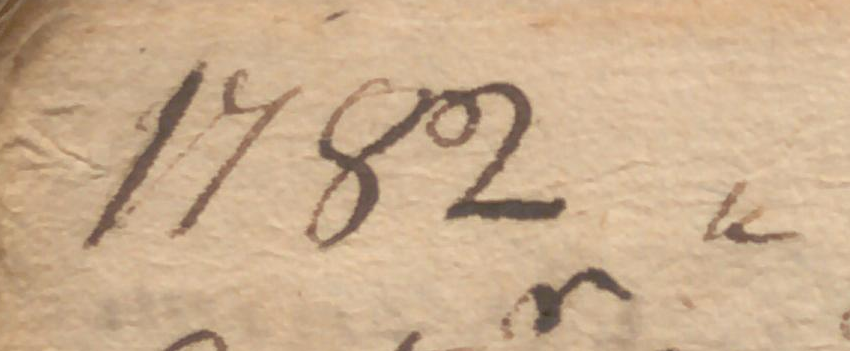1782
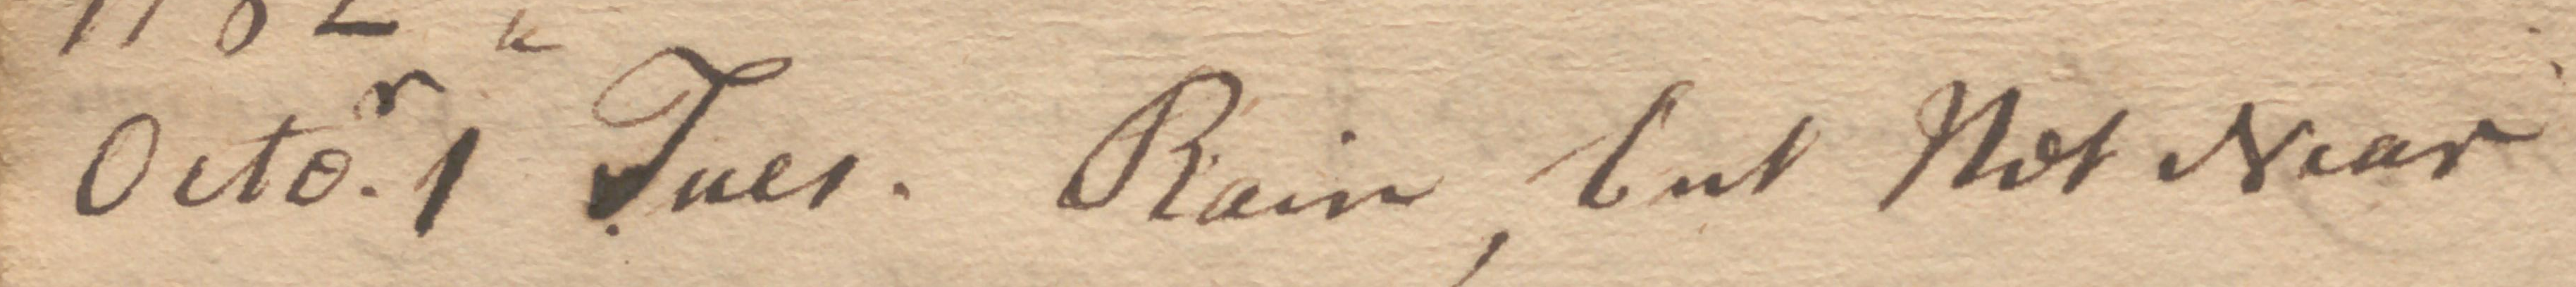Octo^r. 1 Tues. Rain but Not Near
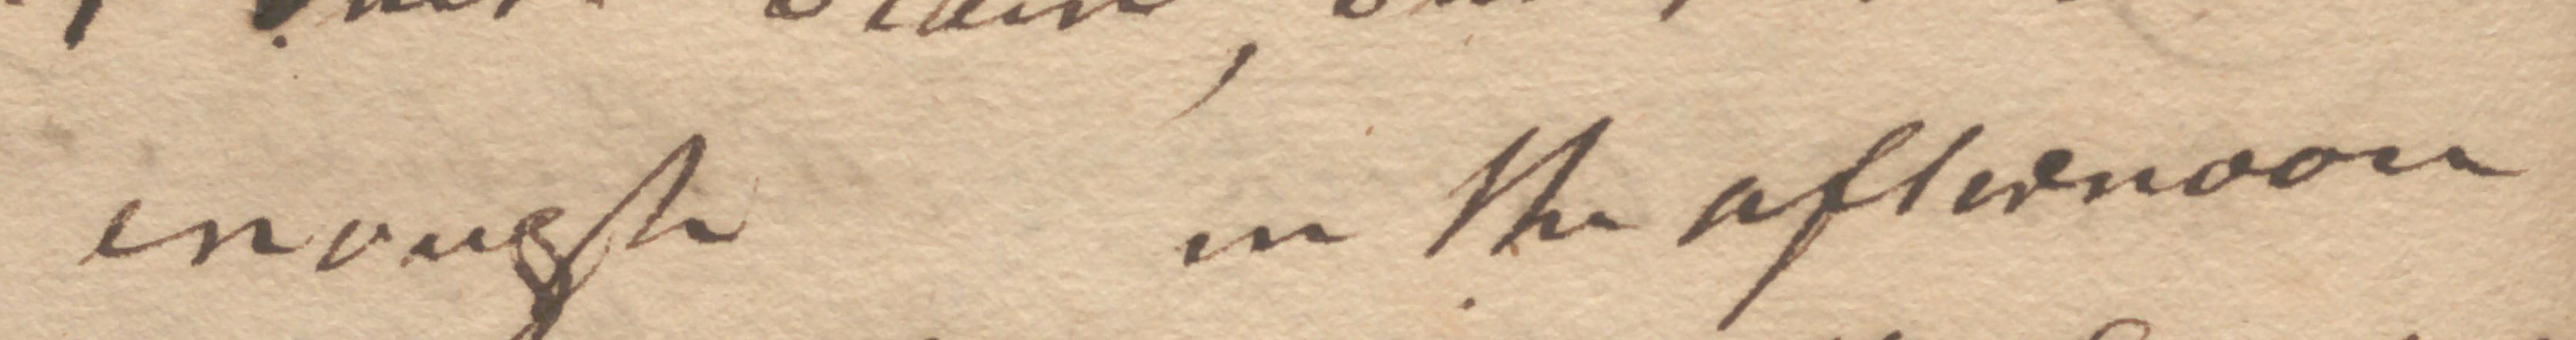enough in the afternoon
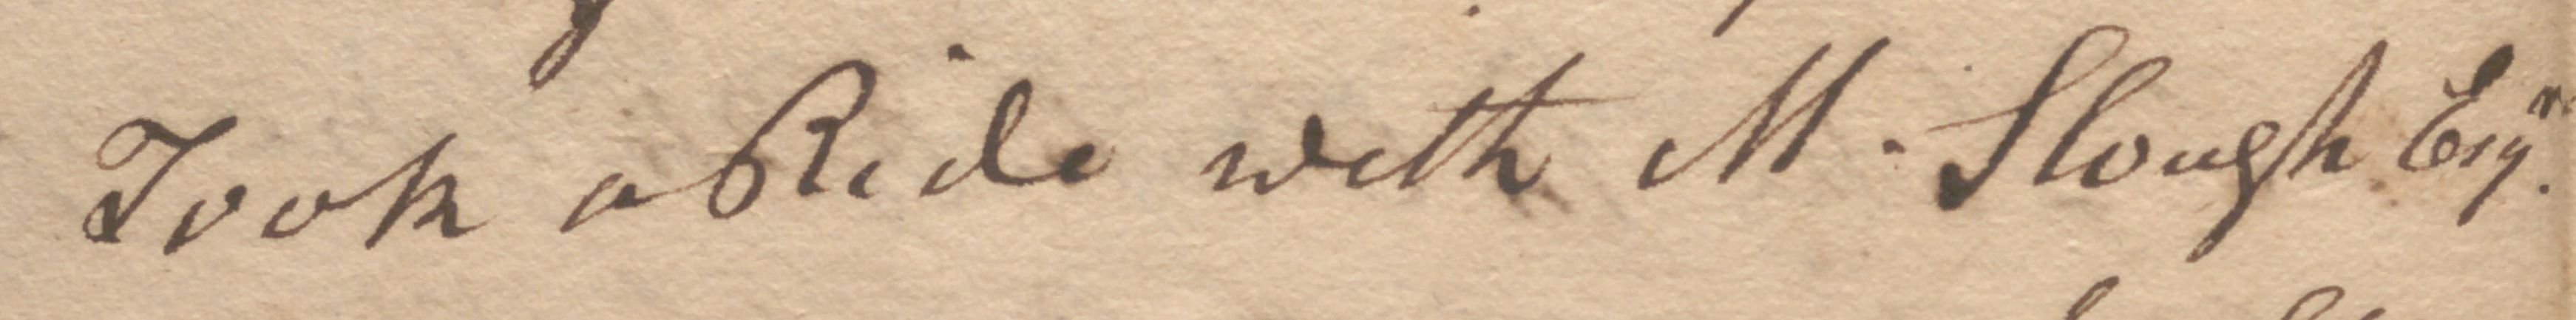Took a Ride with M^r. Slough Esq^r.
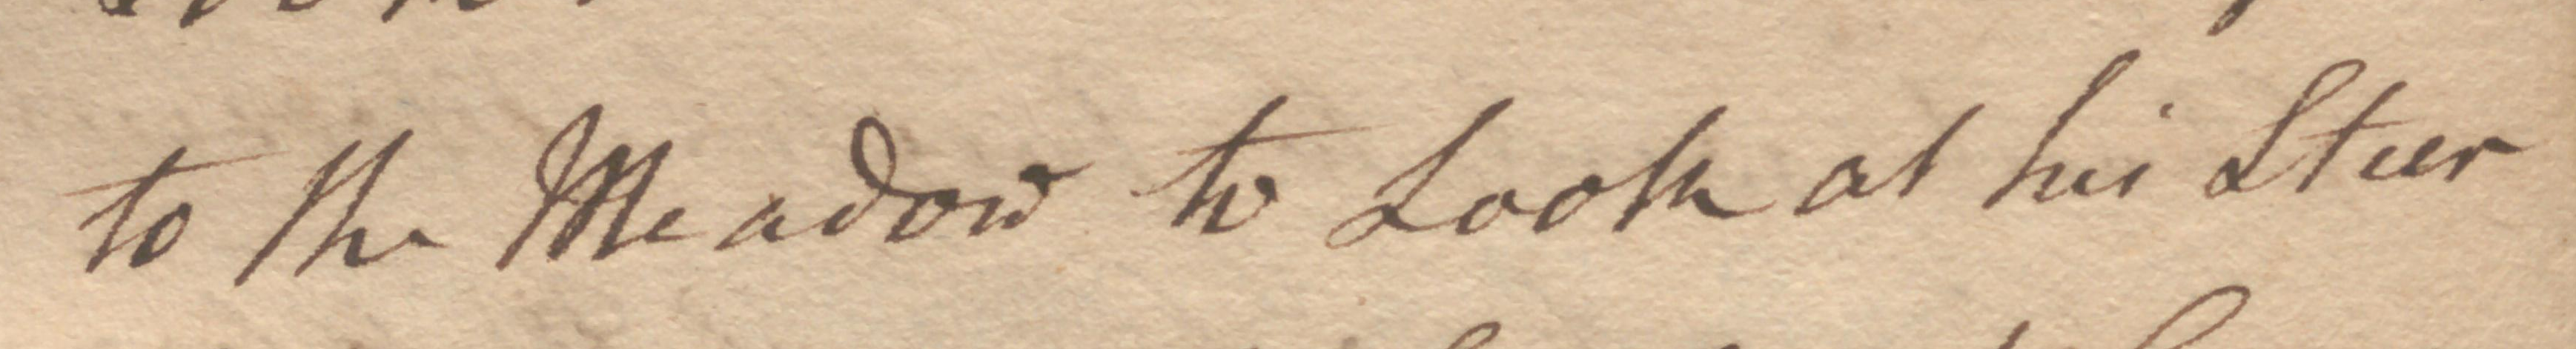to the Meadow to Look at his steer
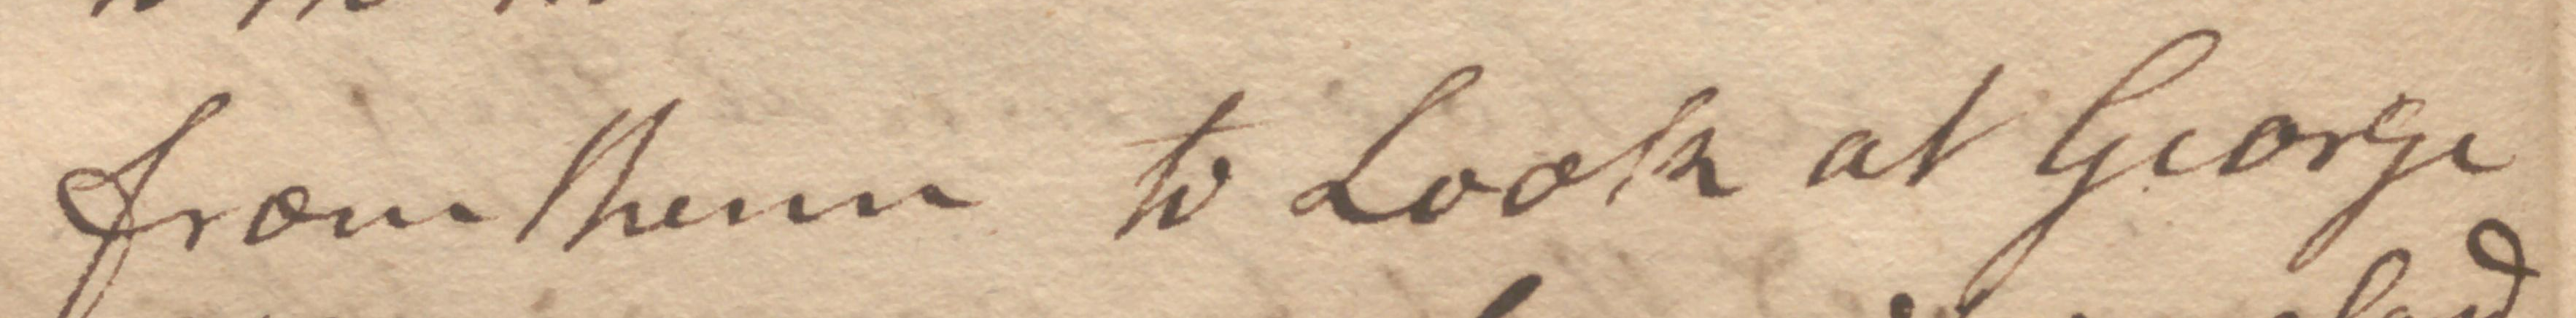from thence to Look at George
